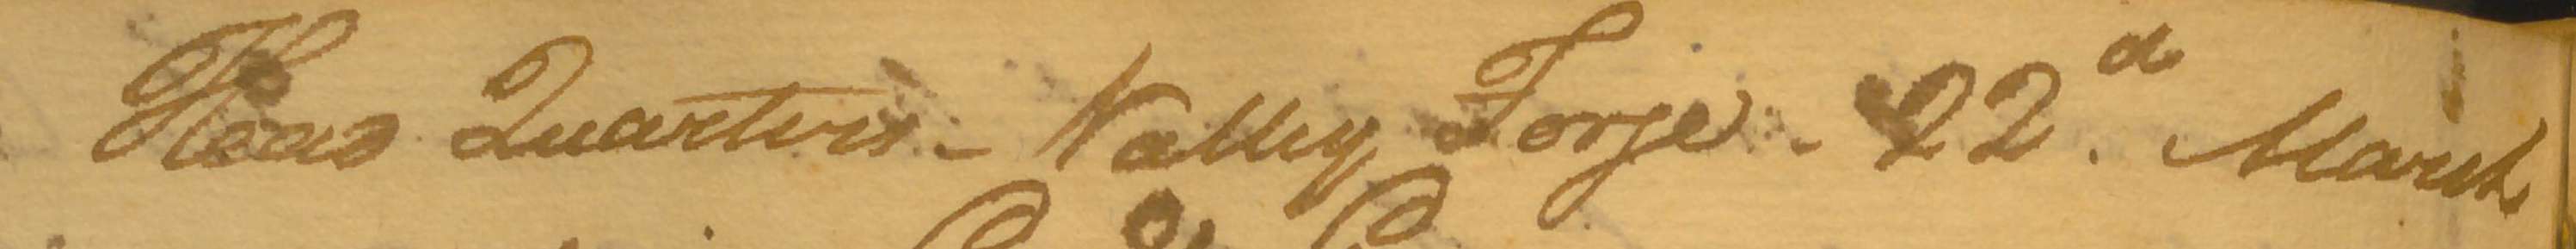Head Quarters- Valley Forge. 22^d. March
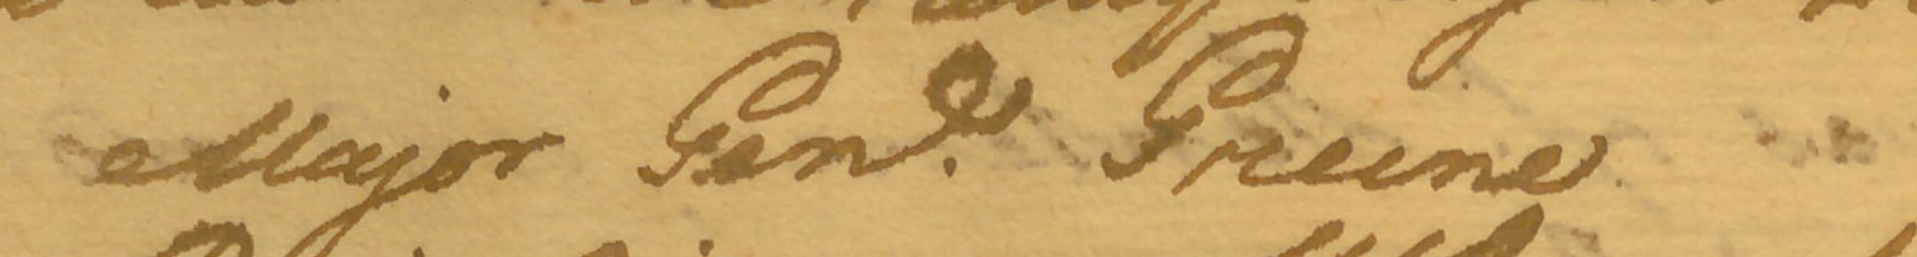Major Gen^l. Greene
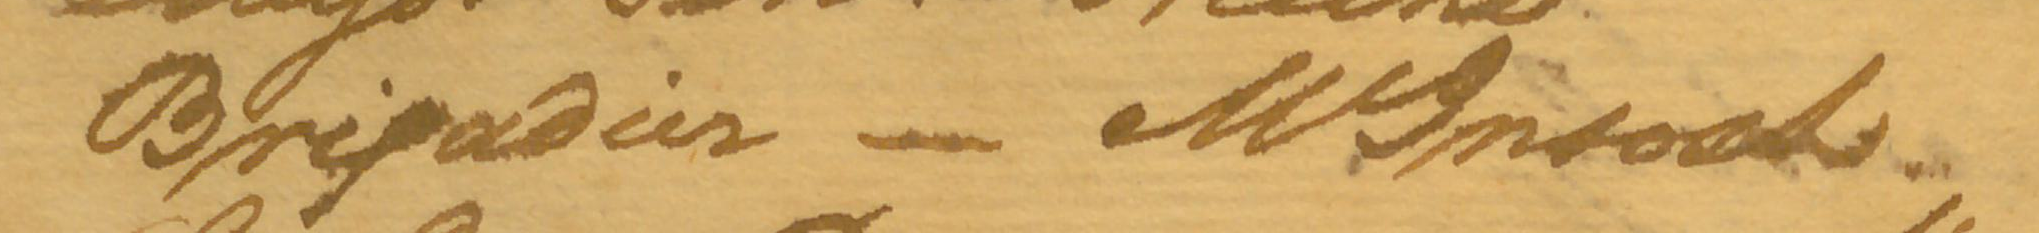Brigadier- M^cInosh
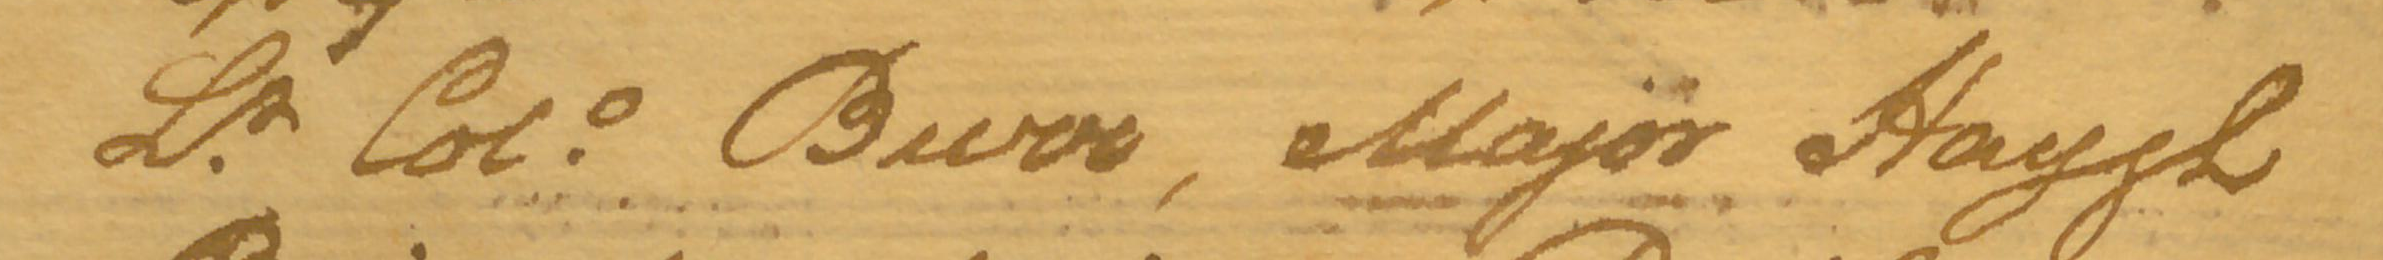L^t. Col^o. Burr, Major Staggh
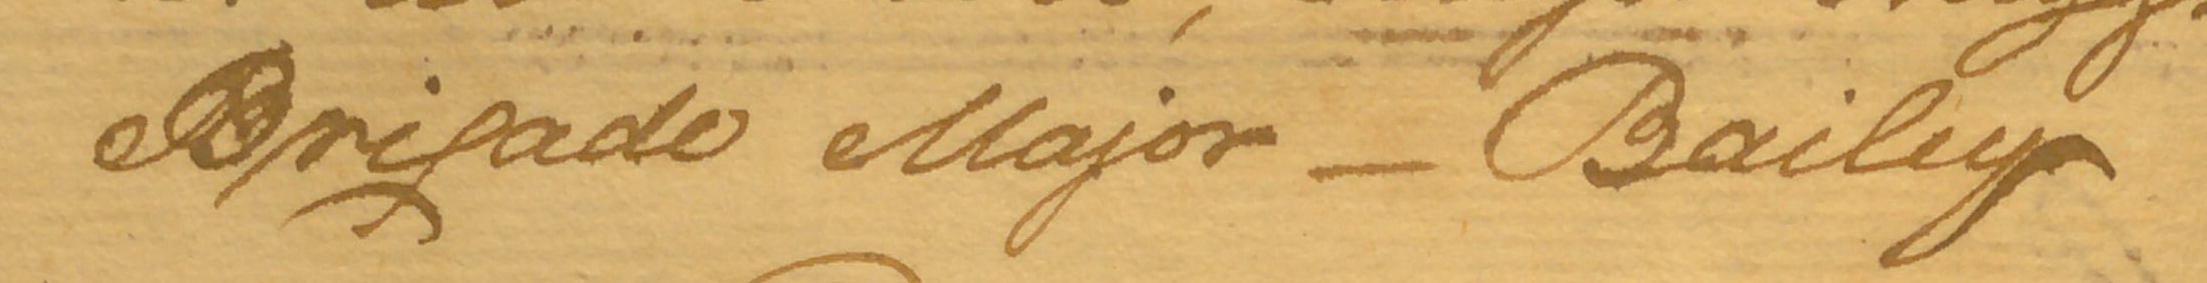Brigade Major- Bailey
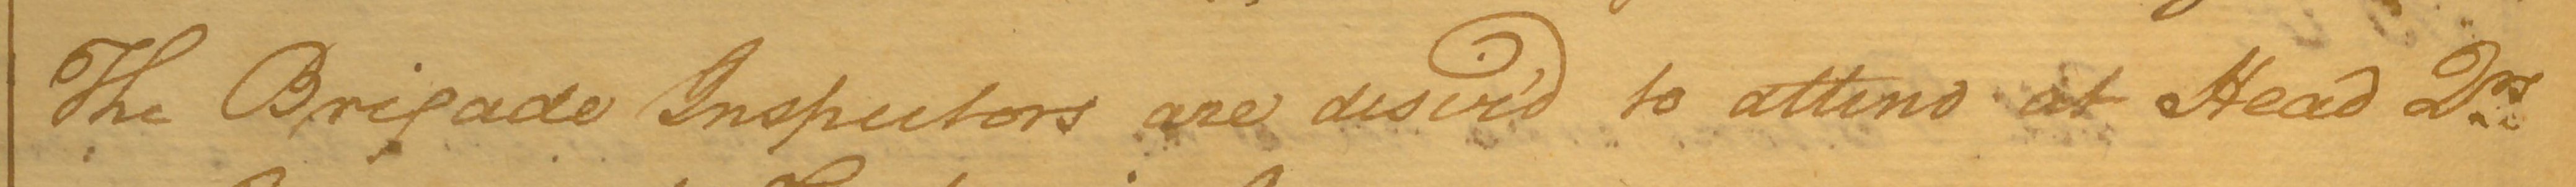The Brigade Inspectors are desir'd to attend at Head Q^rs.
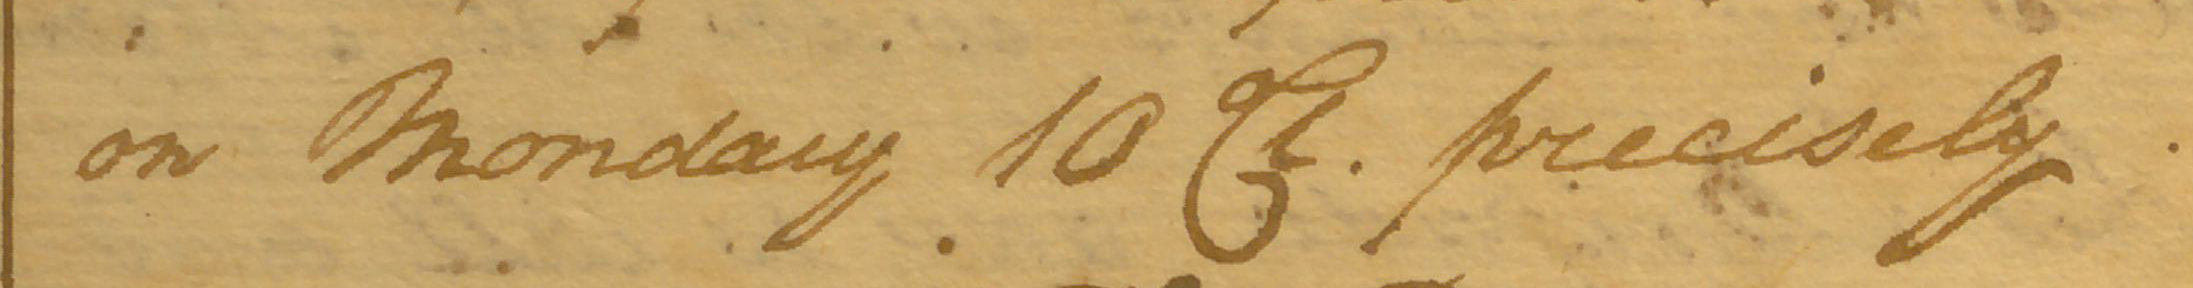on Monday 10 ^oCl. precisely
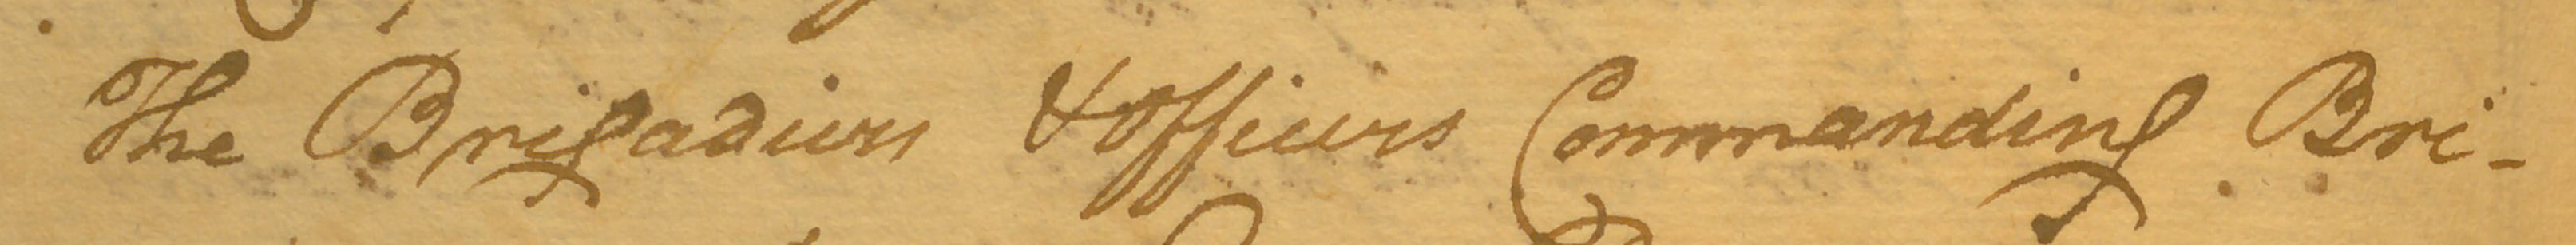The Brigadier & Officers Commanding Bri-
